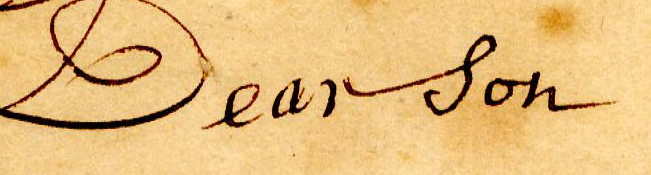Dear Son
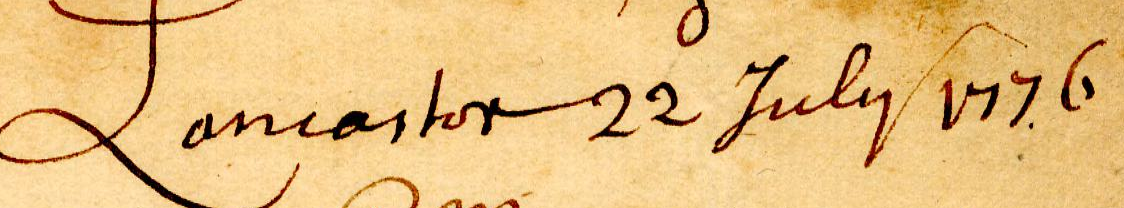Lancaster 22^d July 1776
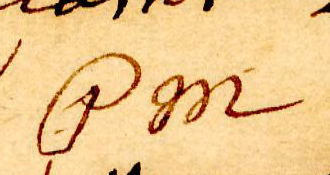PM
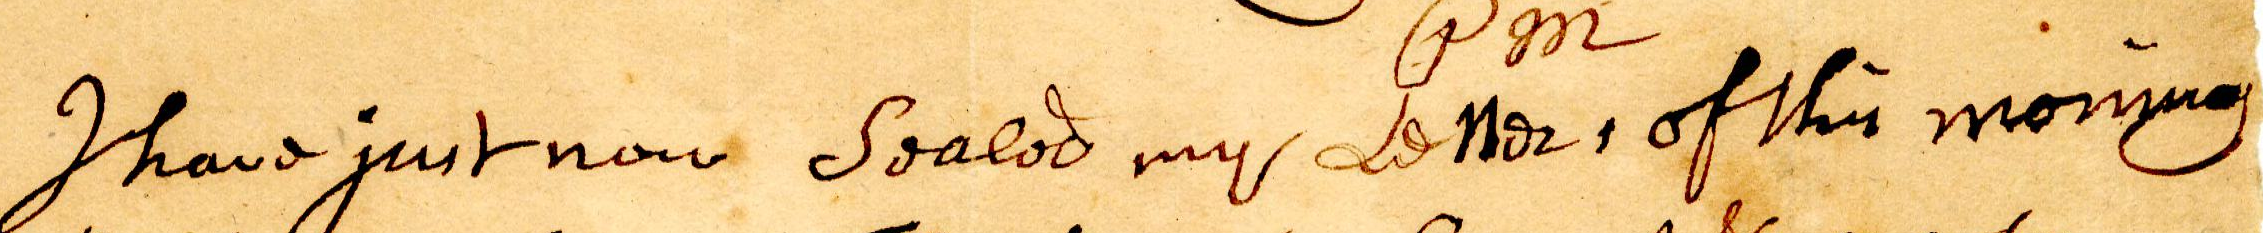I have just now sealed my Letters of this morning
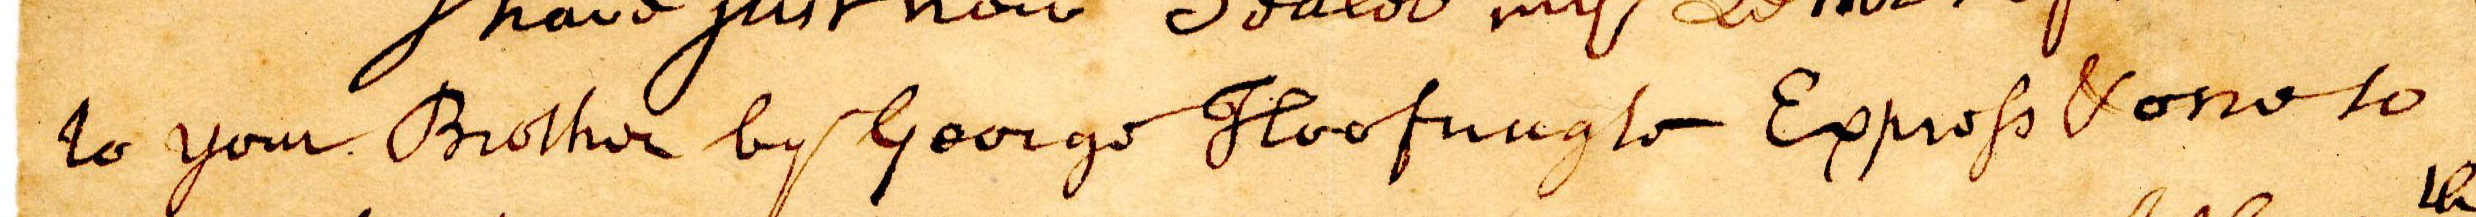to your Brother by George Hoofnagle Express & one to
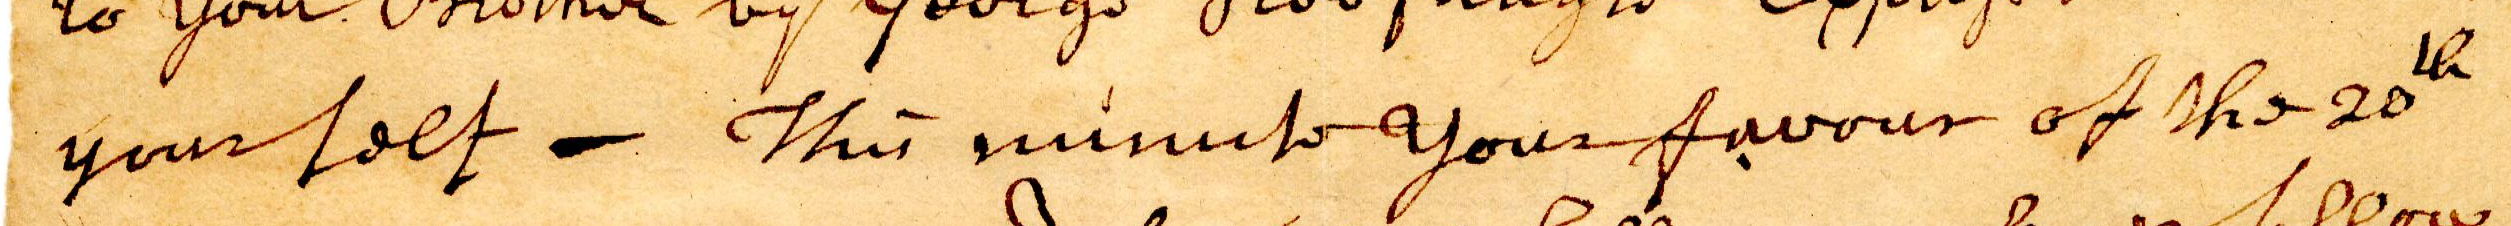yourself- This minute Your favour of the 20^th
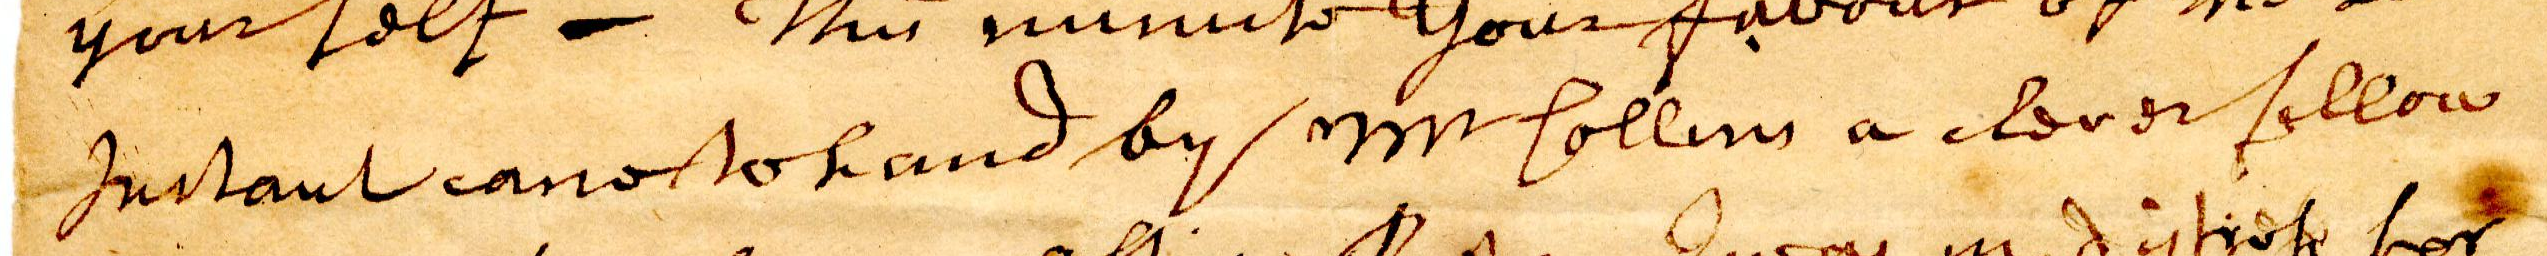Instant came to hand by M^r Collins a clever fellow
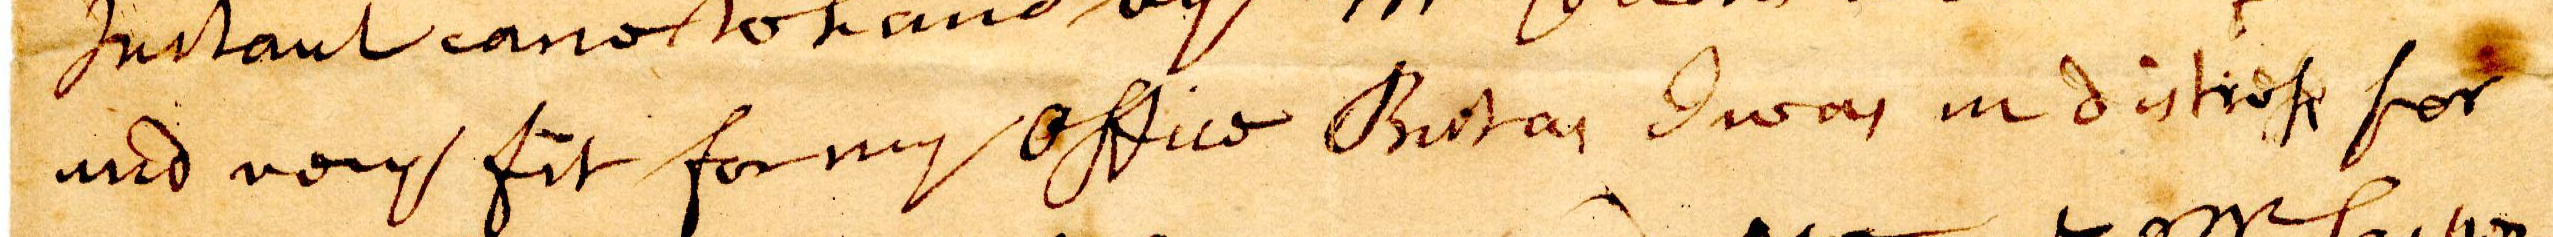and very fit for my office But as I was in distress for
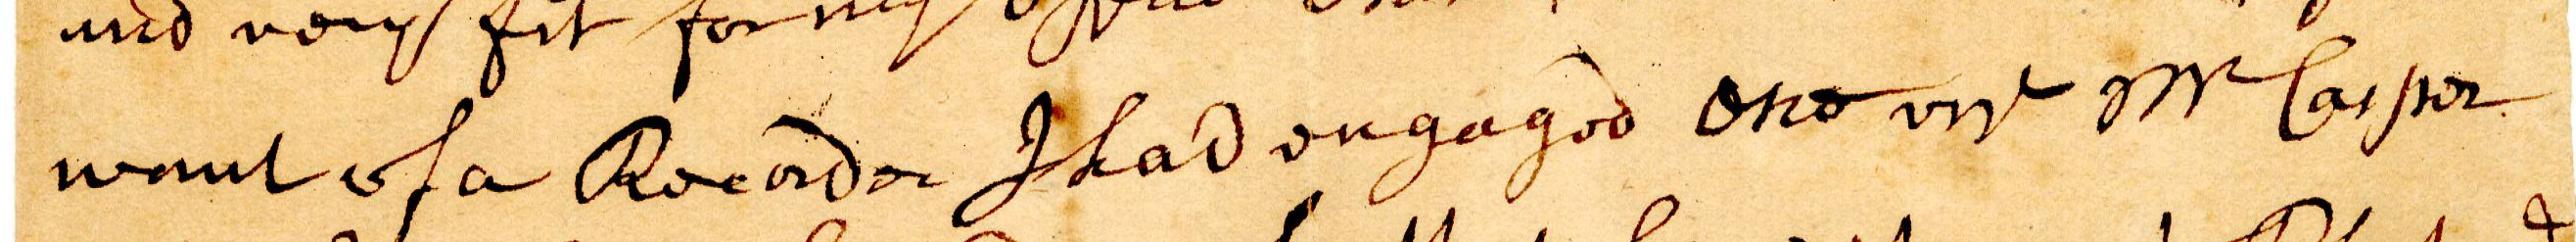want of a Reader I had engaged one m^r M^r Casper
